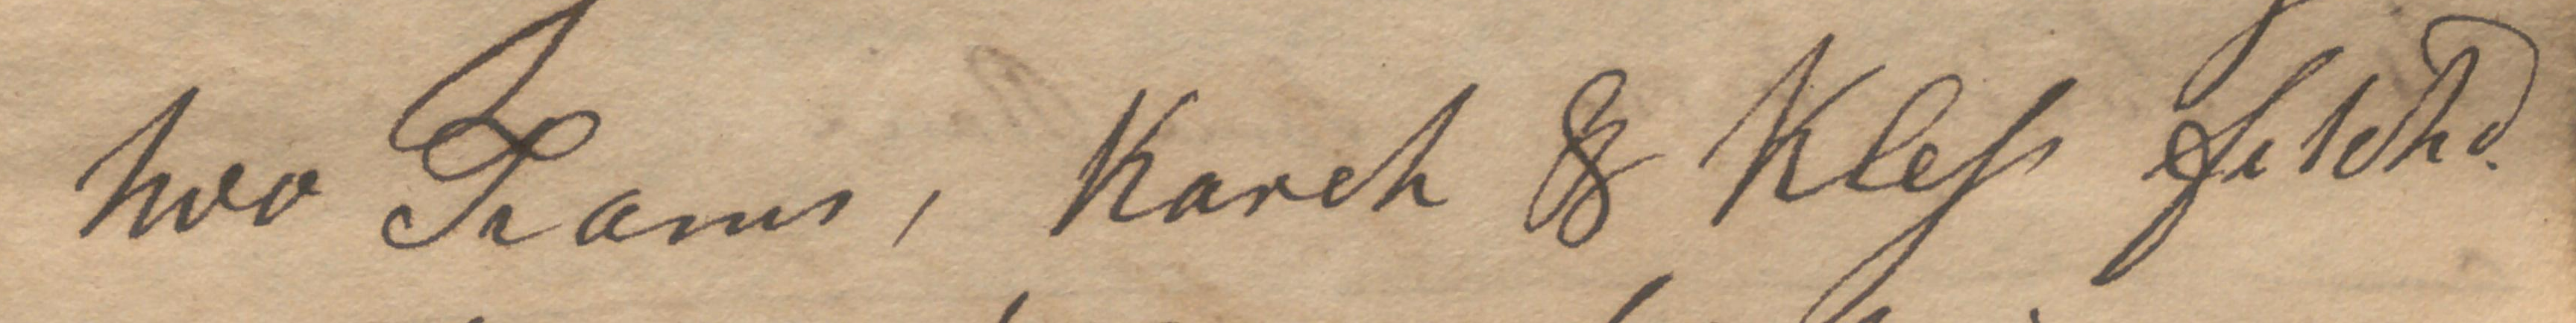twe Teams, Karch & Kless fetchd.
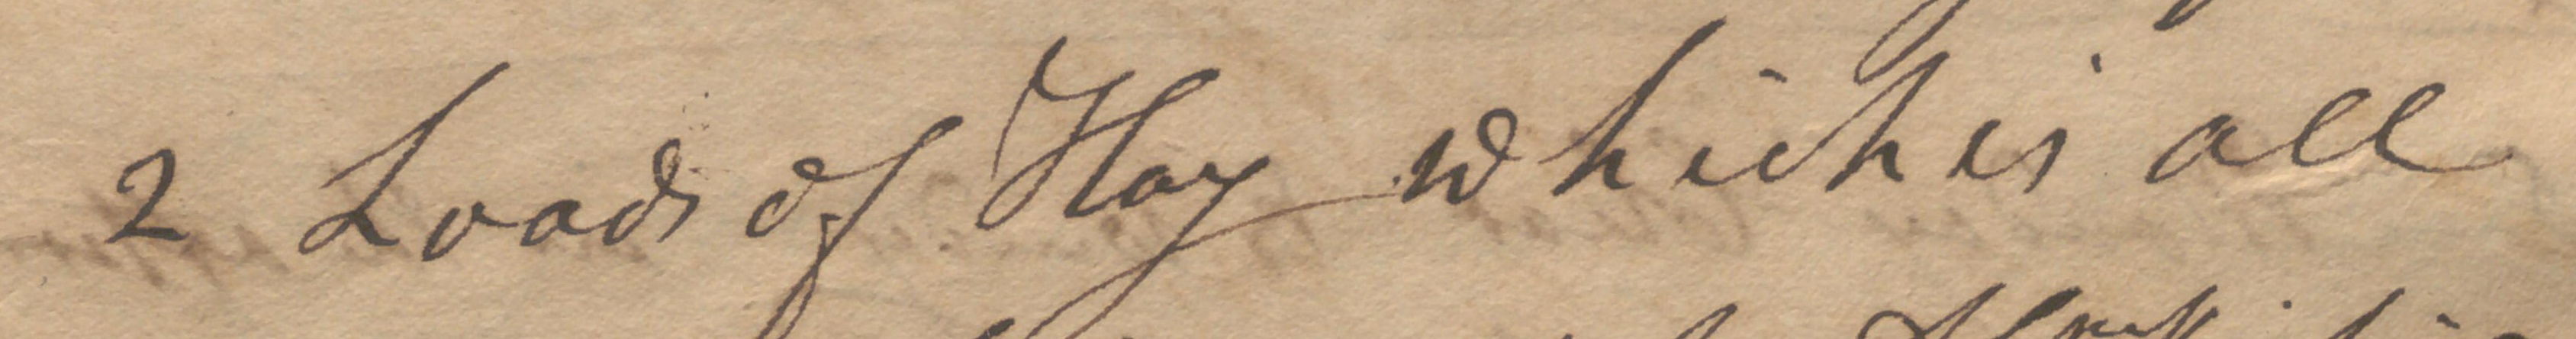2 Loads of Hay which is all
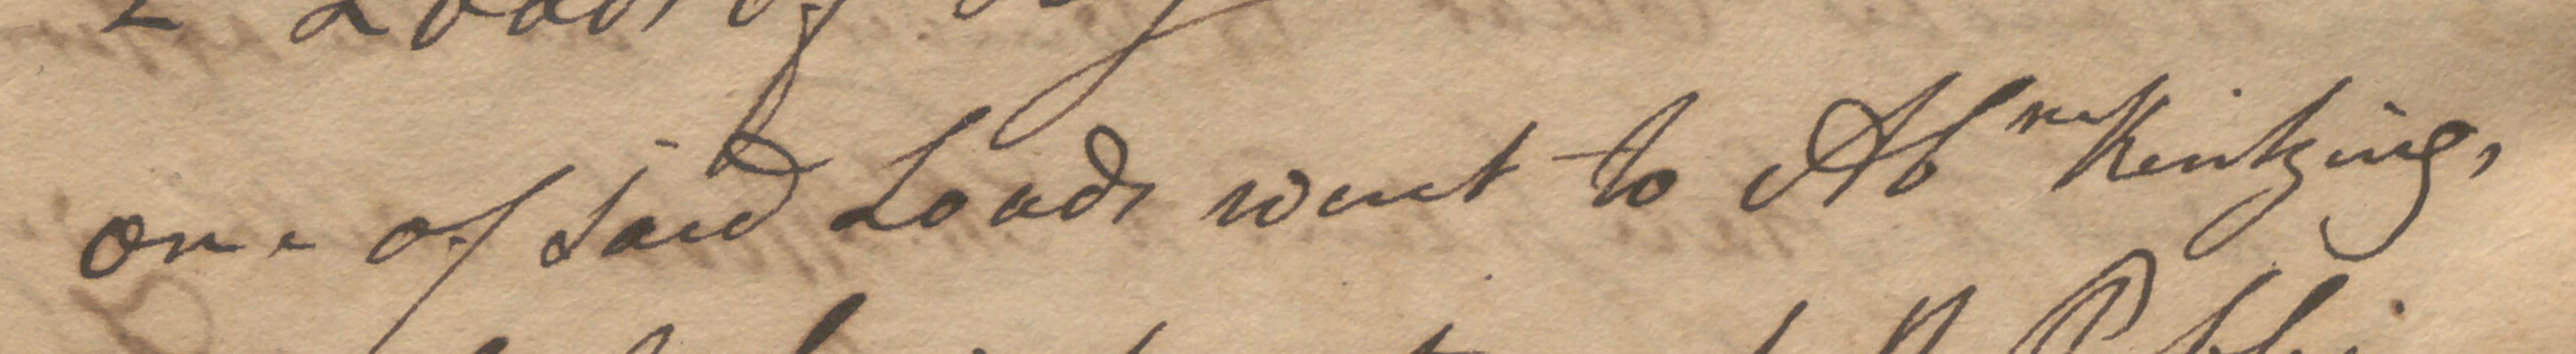one of said Loads went to Ab^m Kintzing,
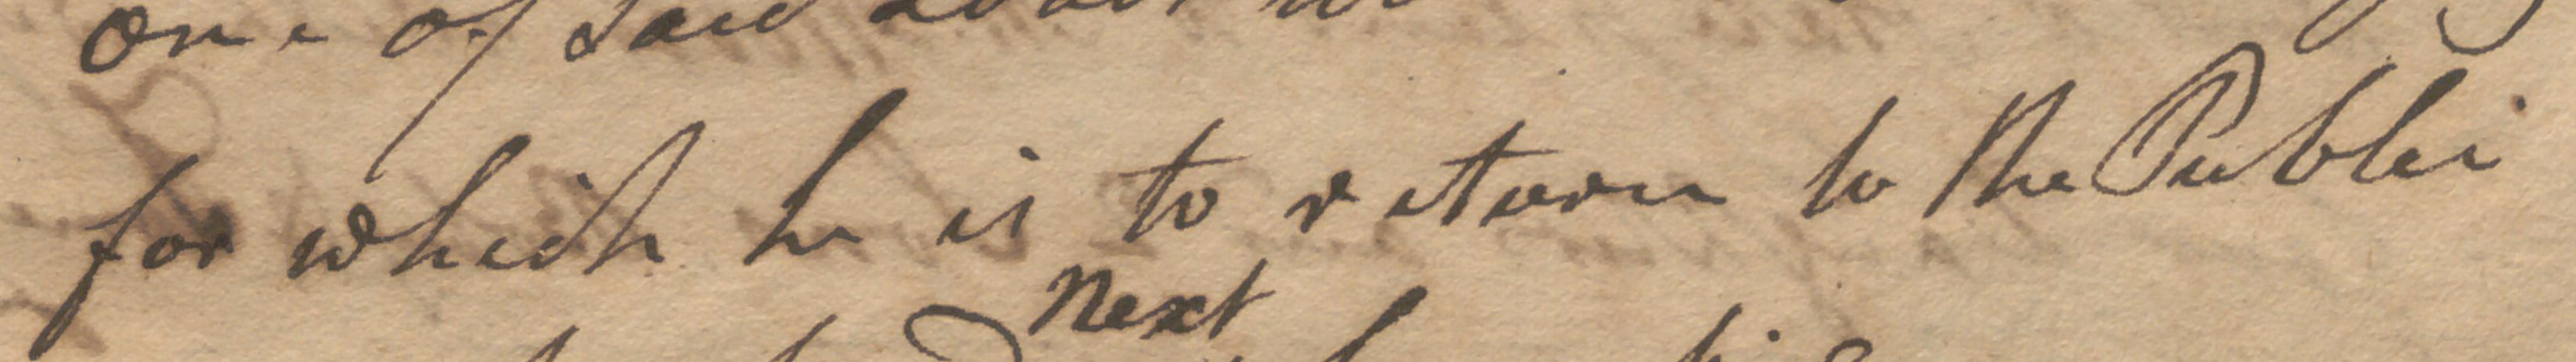for which he is to return to the Public
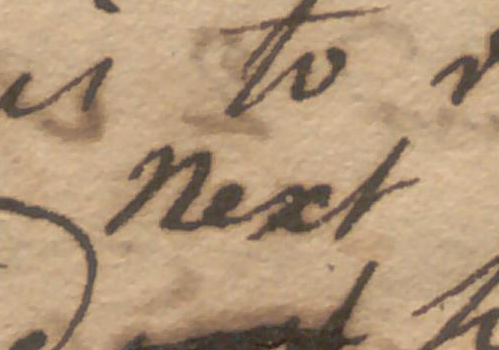next
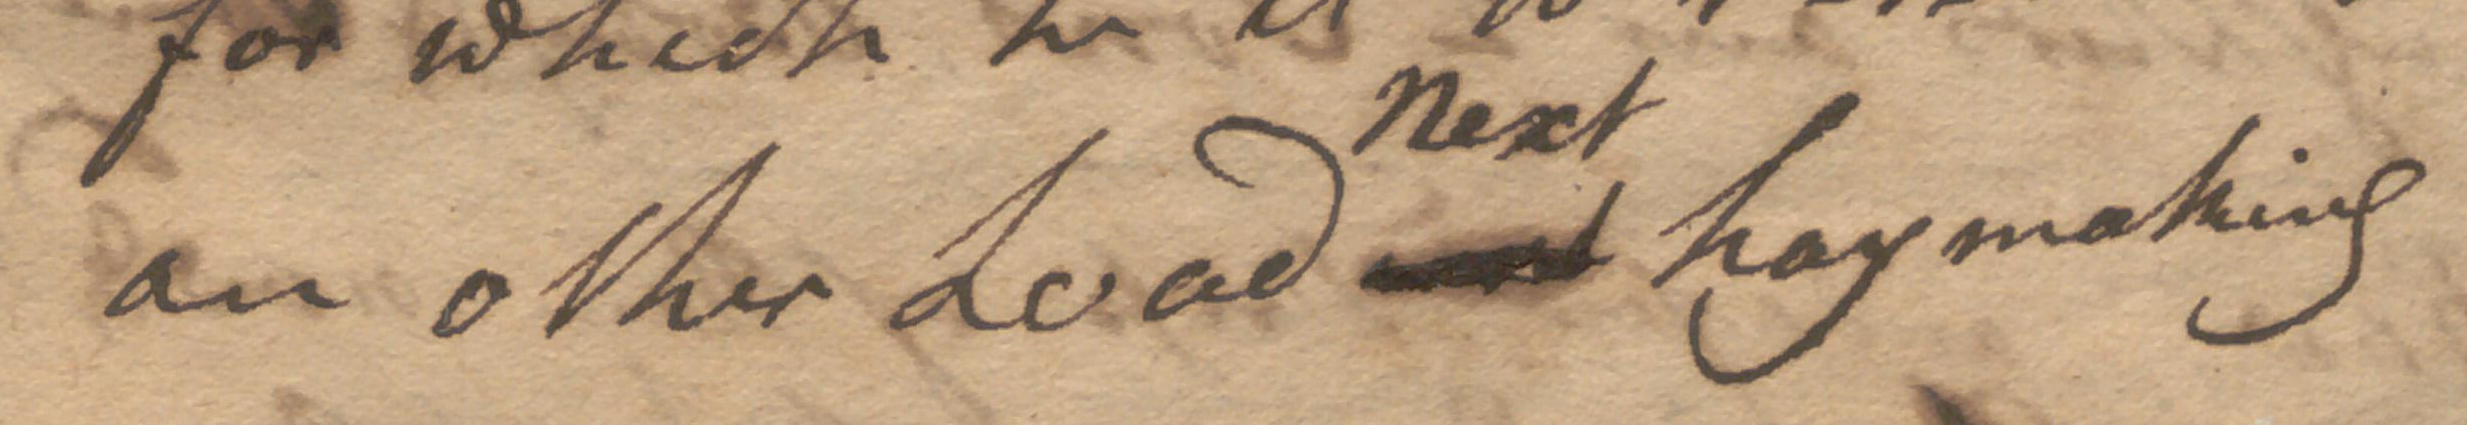are other Lead [___] hay making
